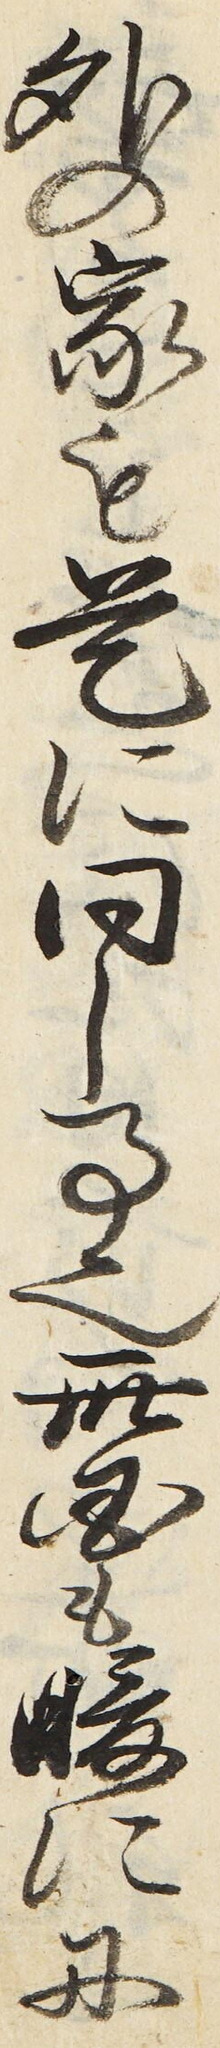外の家も是に同し事也此国も暖にに
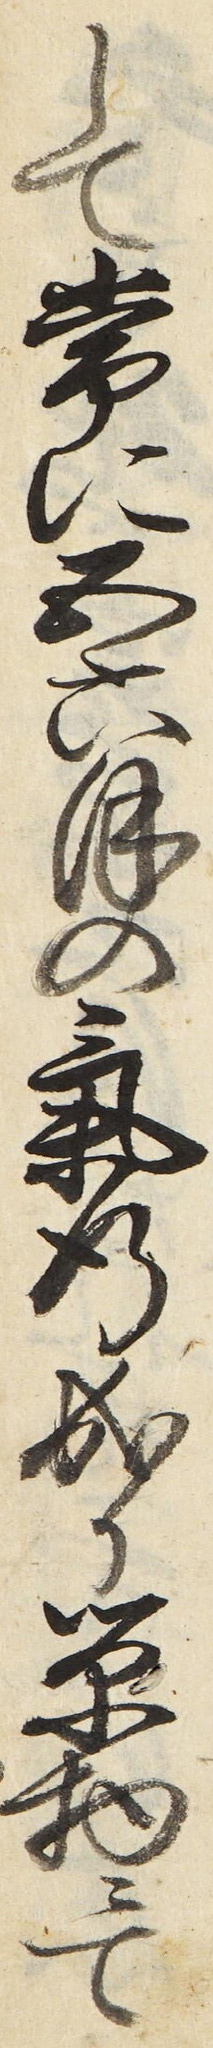して常に五六月の気行成り単物にて

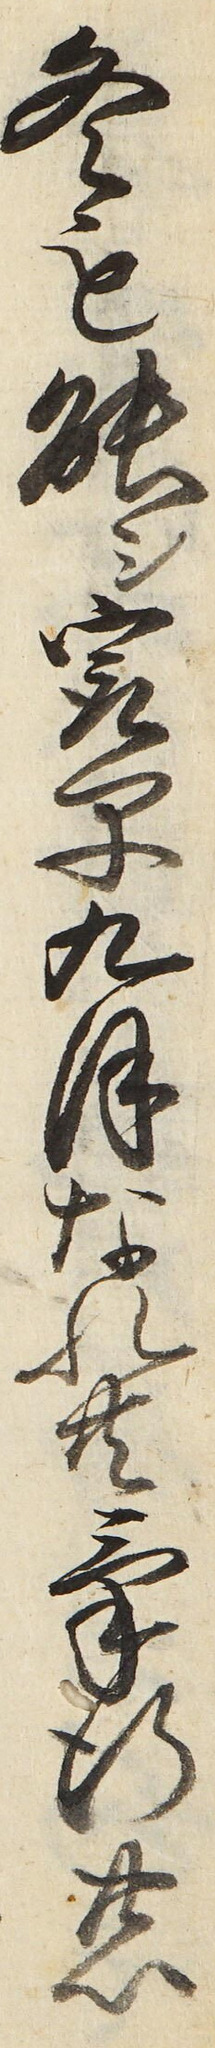冬も能し最早九月なれ共気行の
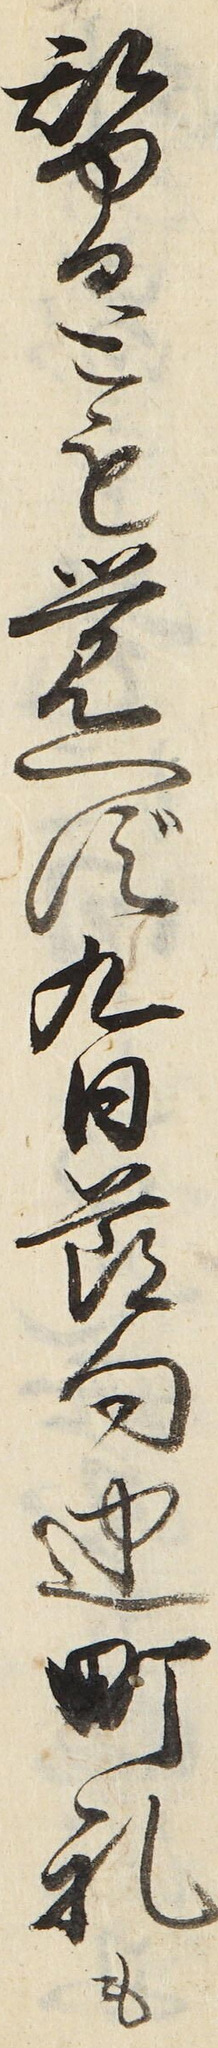替るとも覚へず九月節句迚町礼も
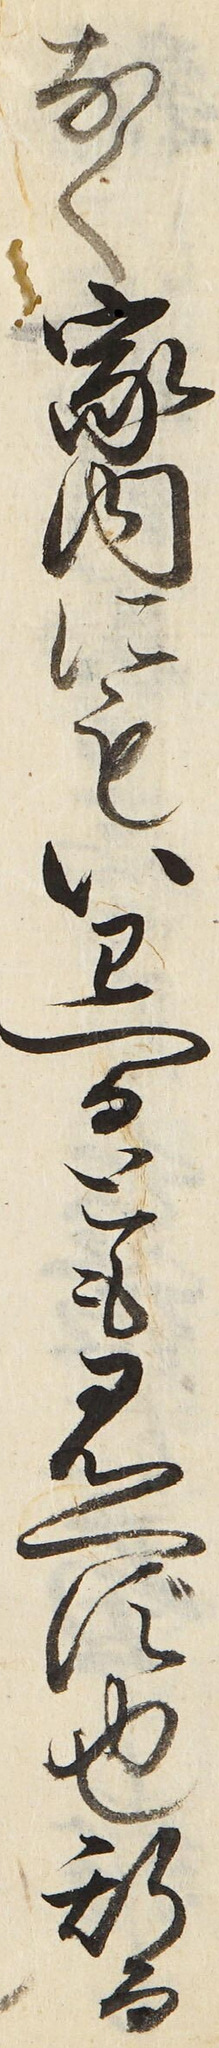なく家内にもいわへるとも見へず也斯而
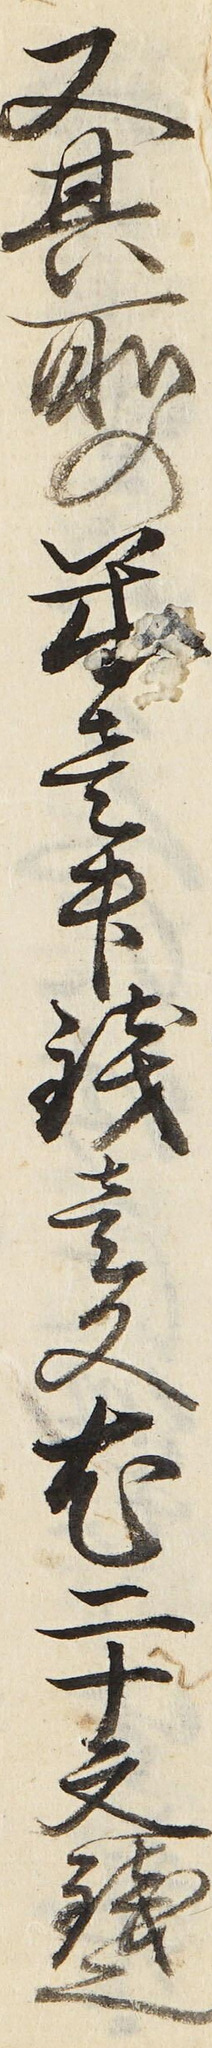又其所の米壱升銭壱文尤二十文銭也
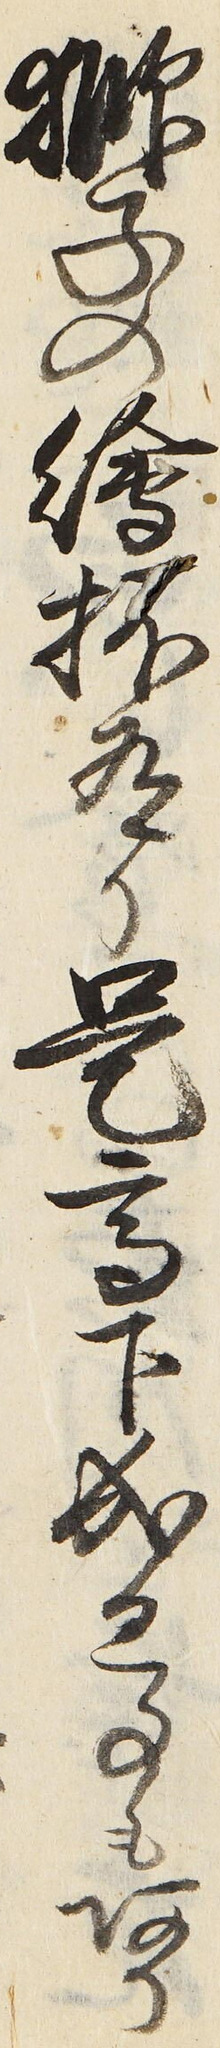獅子の絵抔有り是高下成る事もあり
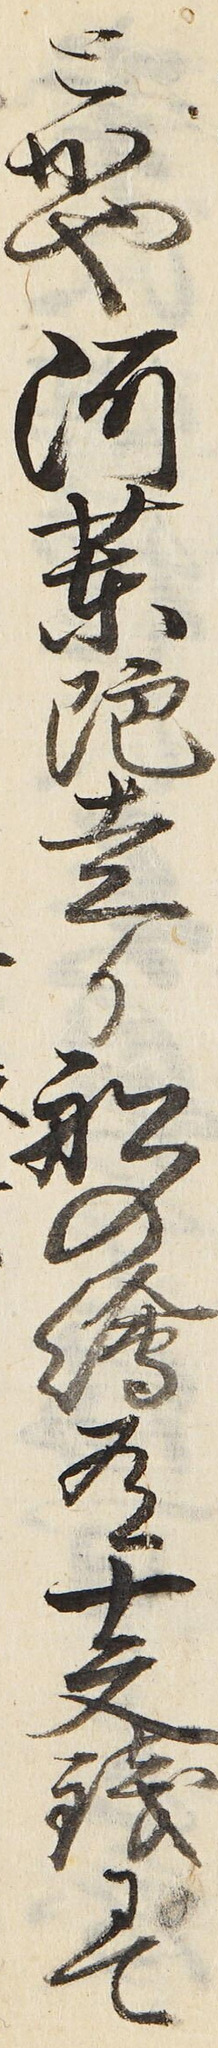とかや阿蘭陀走り船の絵有十文銭にて
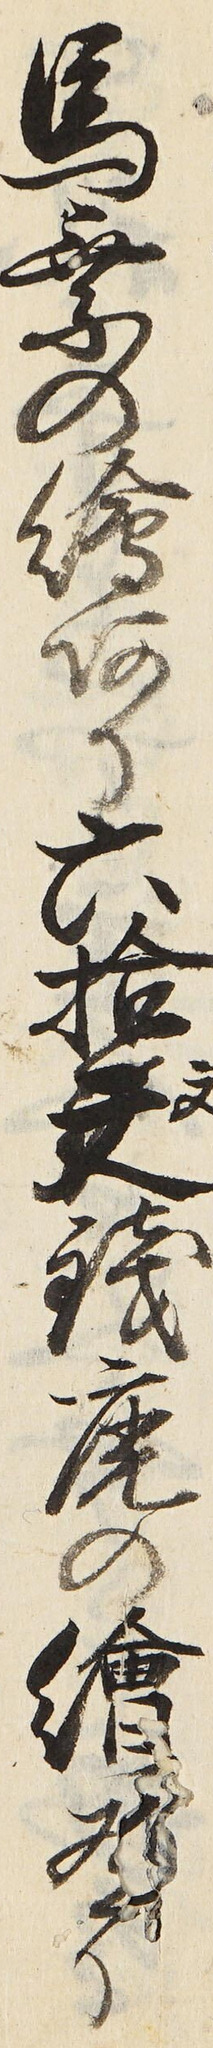馬乗の絵あり六拾文銭の絵有り
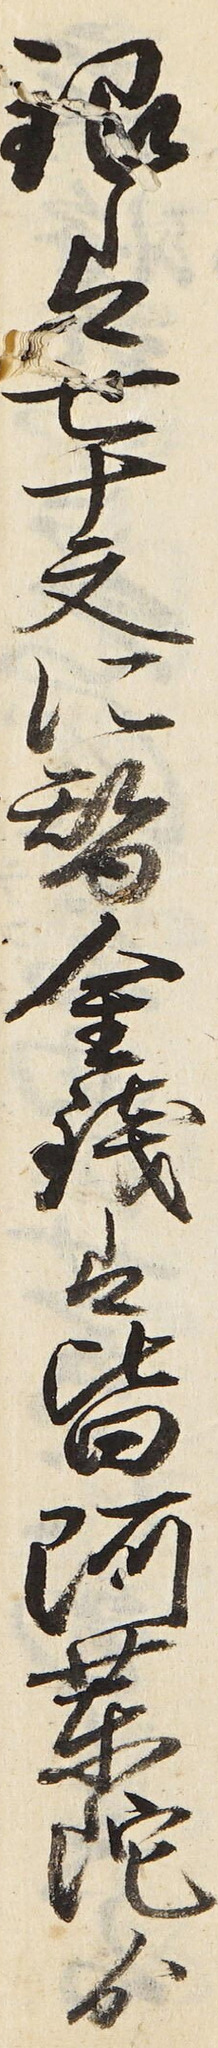銀は七十文に替金銭は皆阿蘭陀ゟ
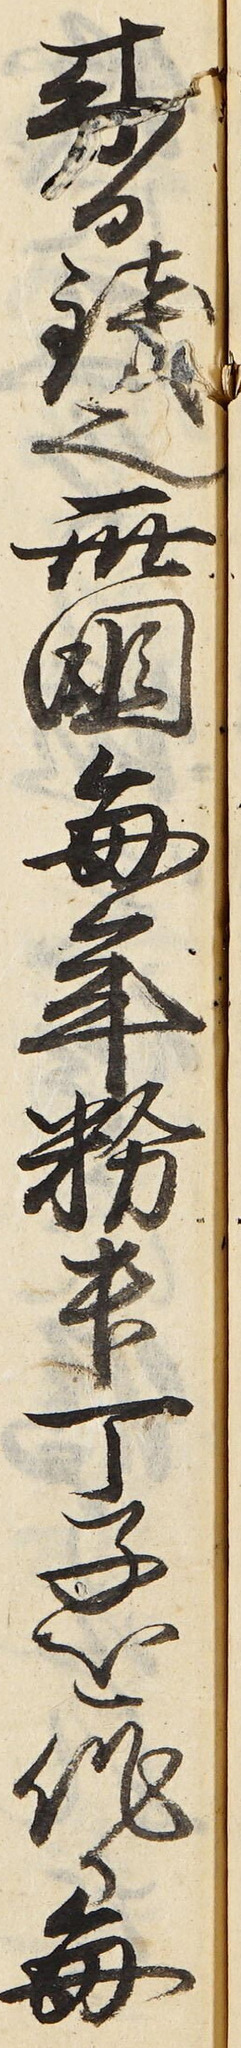来る銭也此国毎年粉升丁子を作り毎
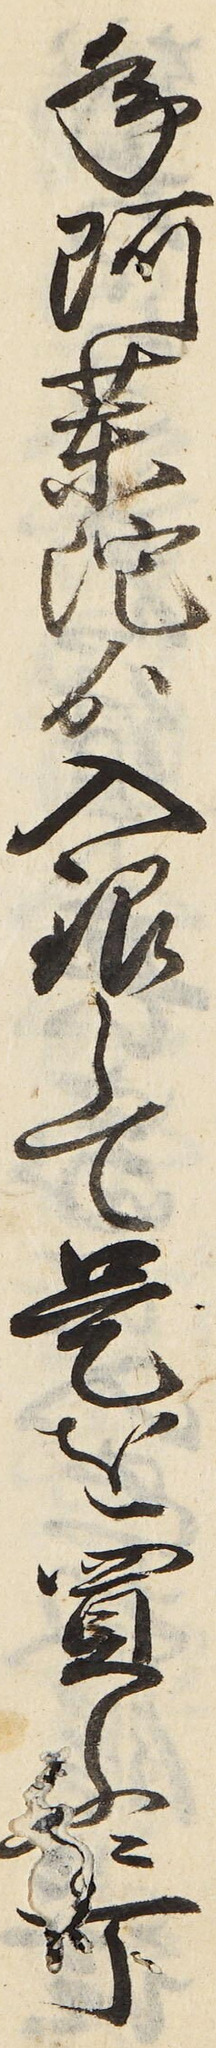年阿蘭陀ゟ入銀して是を買うに丁
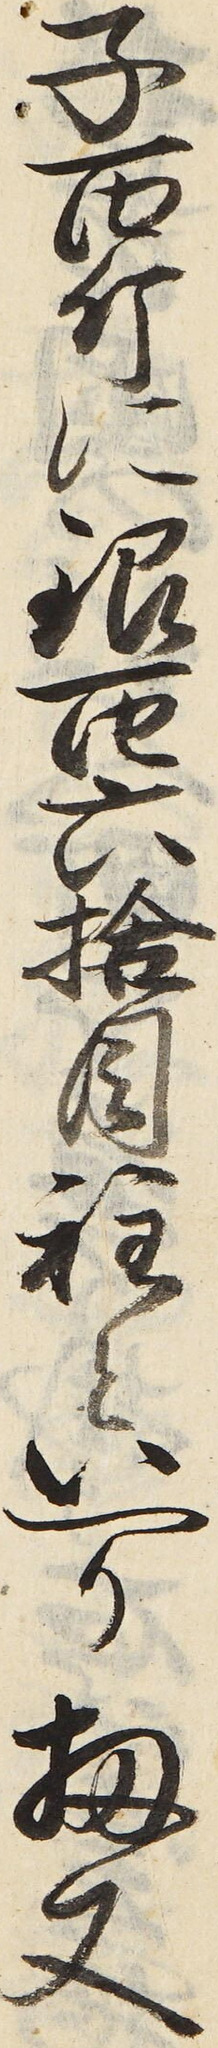子百斤に銀百六拾目程といへり扨又
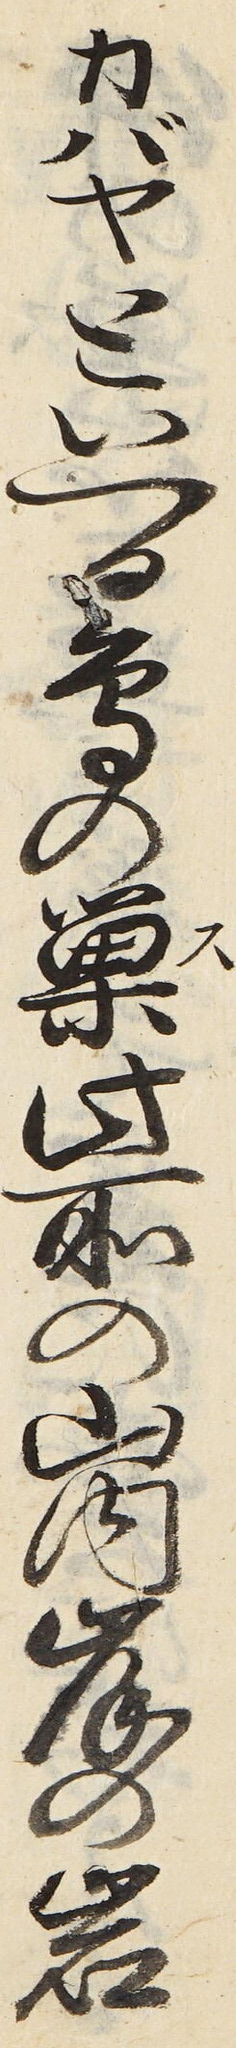カバヤといへる鳥の巣此所の山内岸の岩
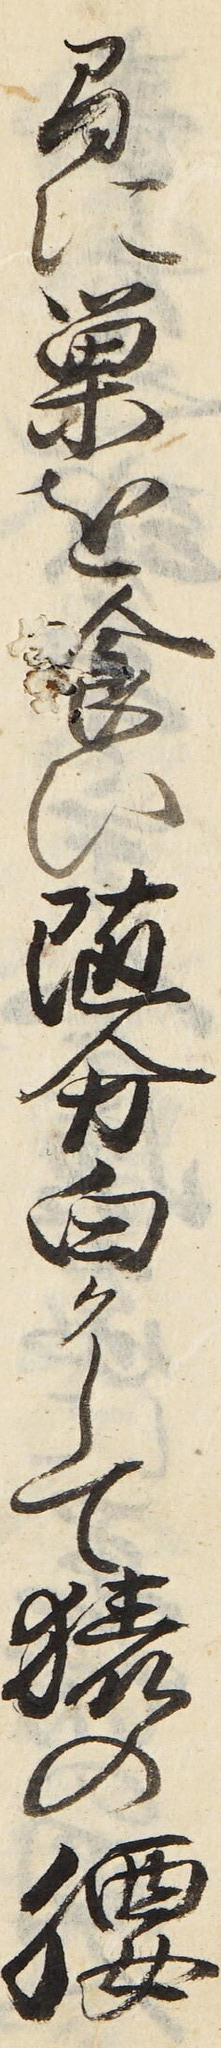間に巣を喰ひ随分白くして猿の腰
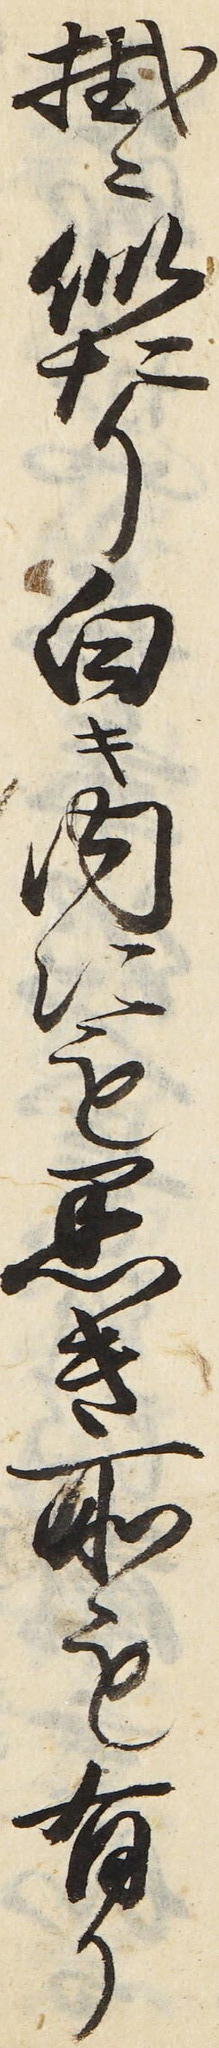掛に似たり白き内にも黒き所も有り
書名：華夷九年録
